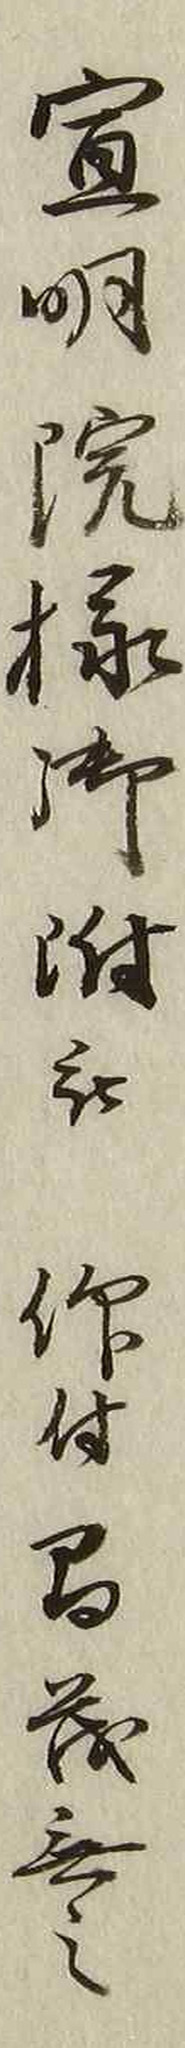宣明院様御附被仰付間茂無之
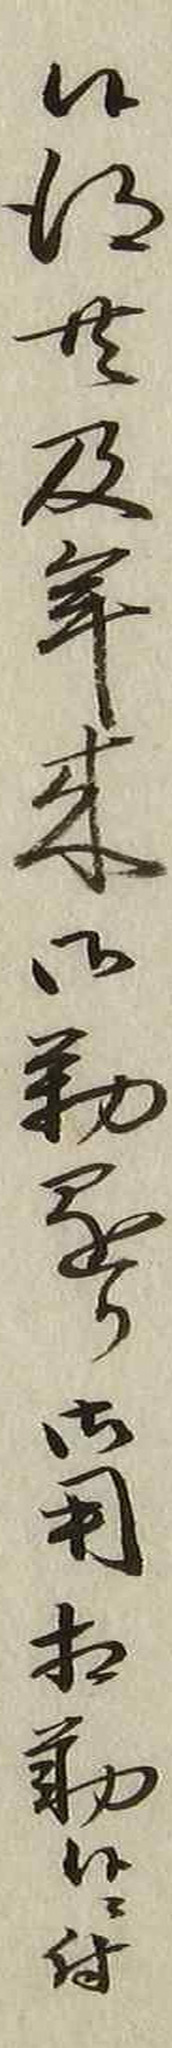候得共及年末御勤懸り御用相勤候ニ付
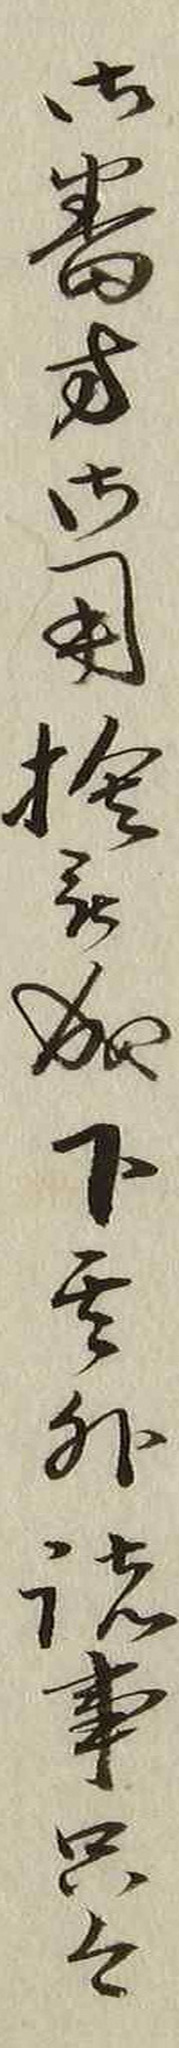御番方御用捨被成下其外諸事只今
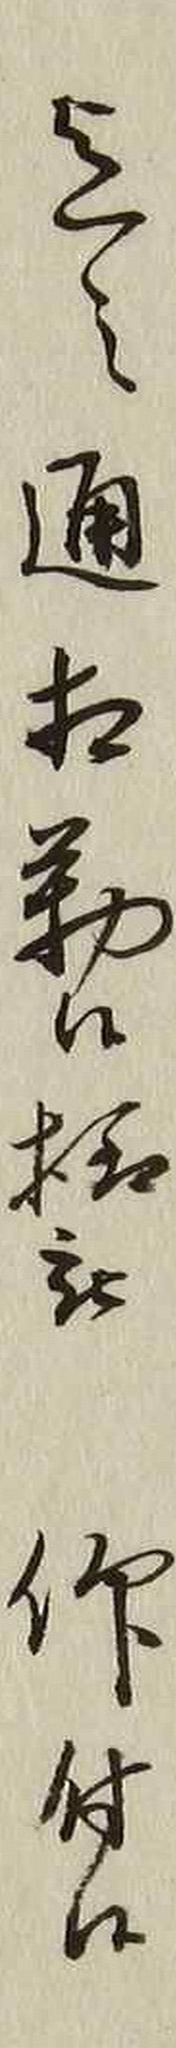迄之通相勤候様被仰付候
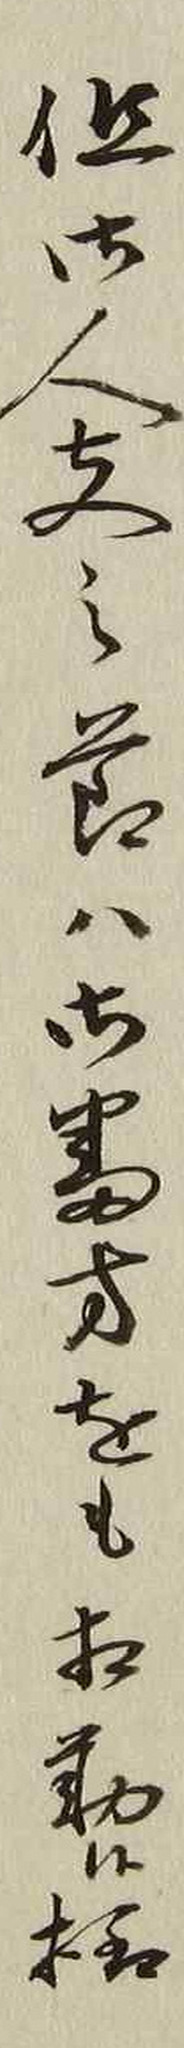但御人支之節は御番方をも相勤候様
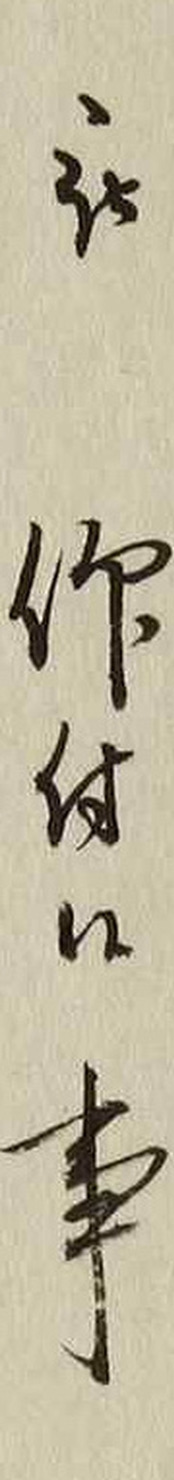被仰付候事
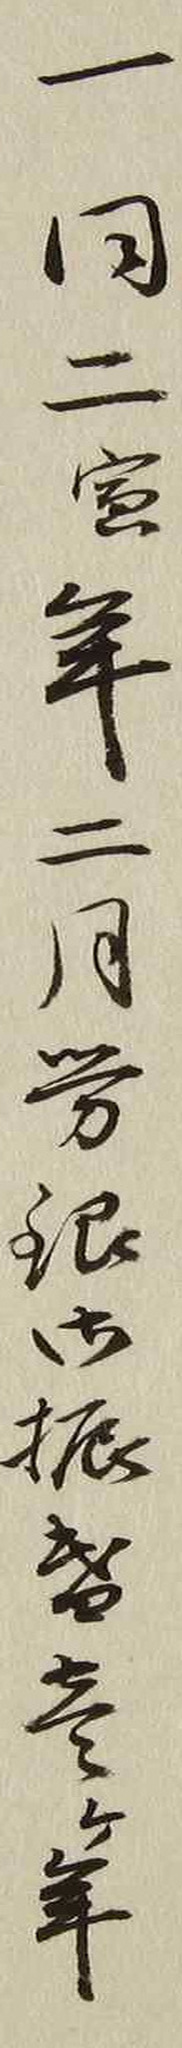一同二寅年二月労銀御振替壱ケ年
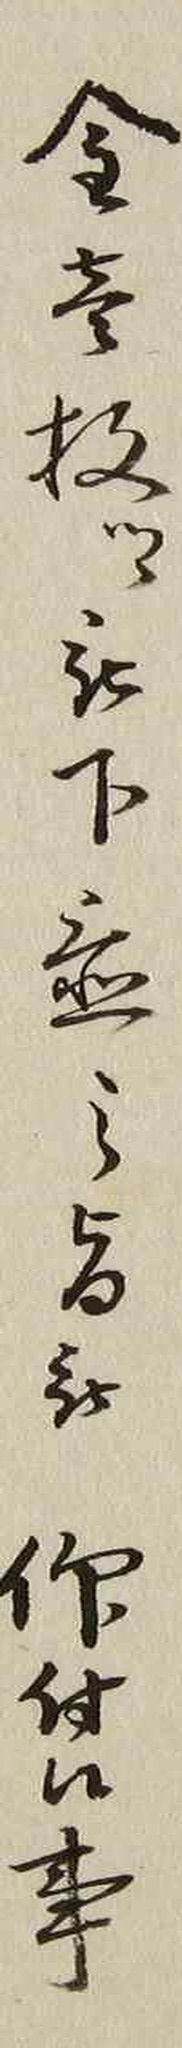金壱枚ツヽ被下置之旨被仰付候事
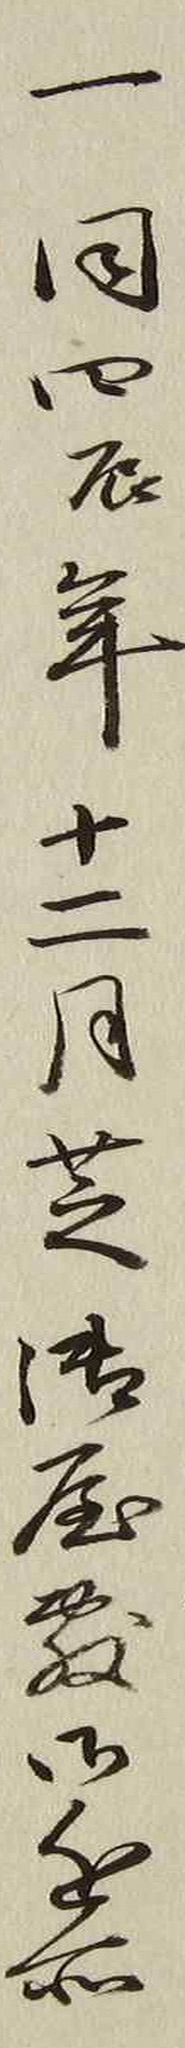一同四辰年十二月芝御屋敷御近所
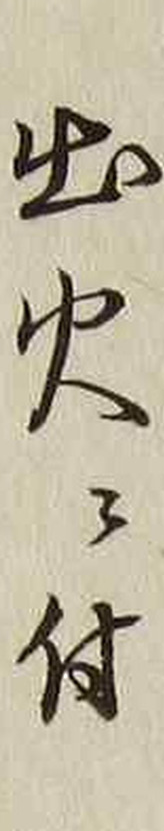出火ニ付
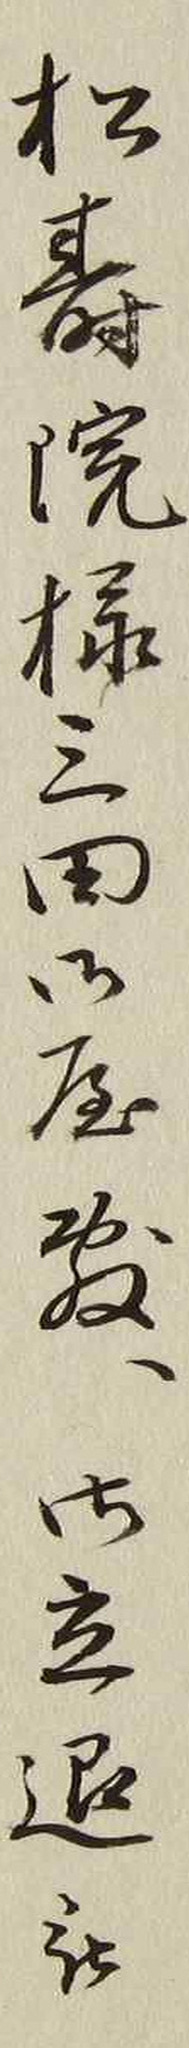松寿院様三田御屋敷へ御立退被
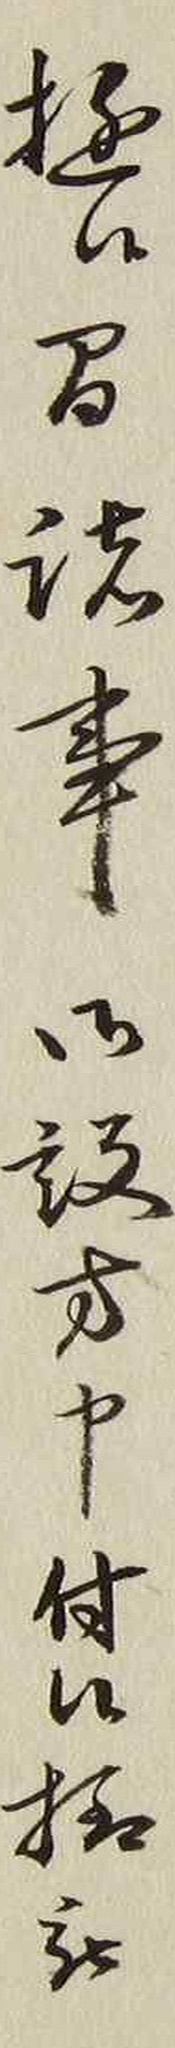遊候間諸事御設方申付候様被
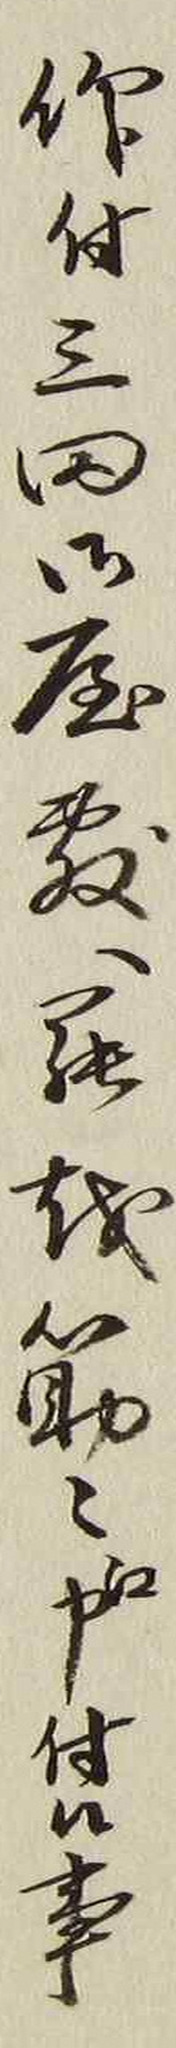仰付三田御屋敷へ罷越筋々え申付候事
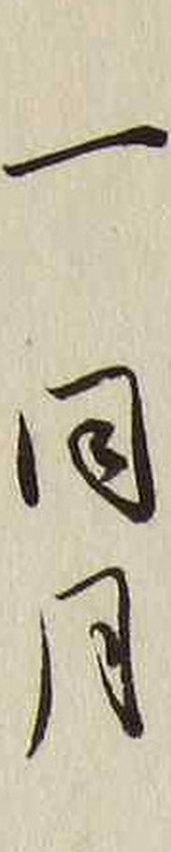一同月
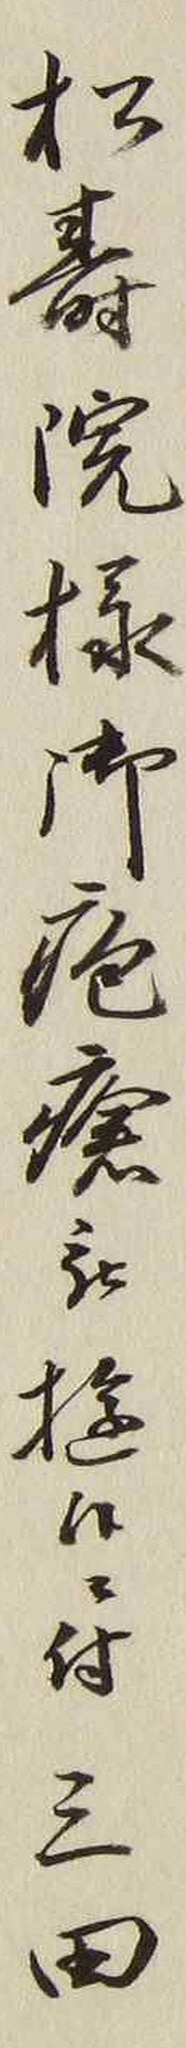松寿院様御疱瘡被遊候ニ付三田

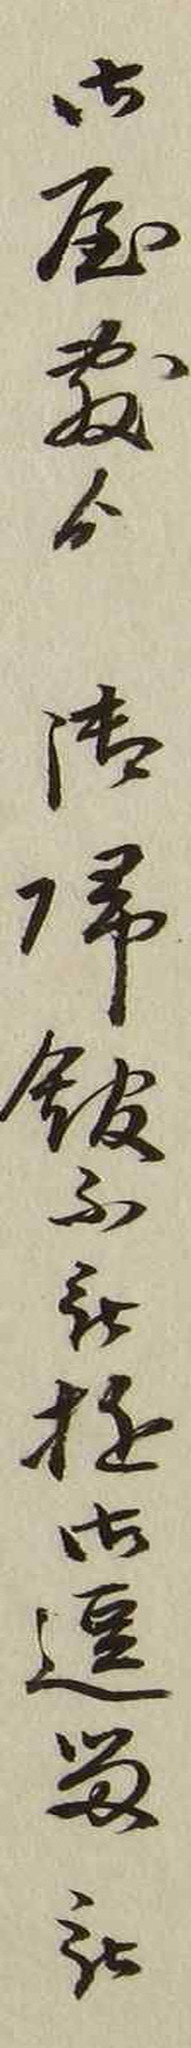御屋敷ゟ御帰館不被遊御逗留被
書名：諸士系譜　巻之160　な之部2
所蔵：会津若松市立会津図書館
